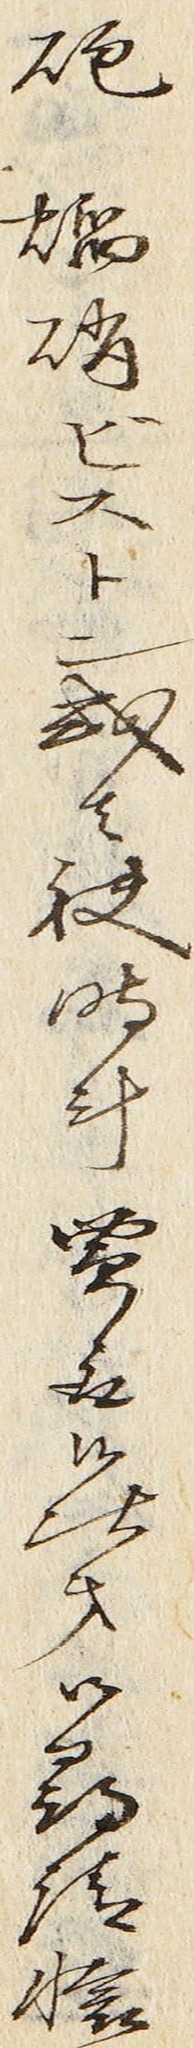砲焔硝ビストン或は袂時計買取候次第御尋請懐
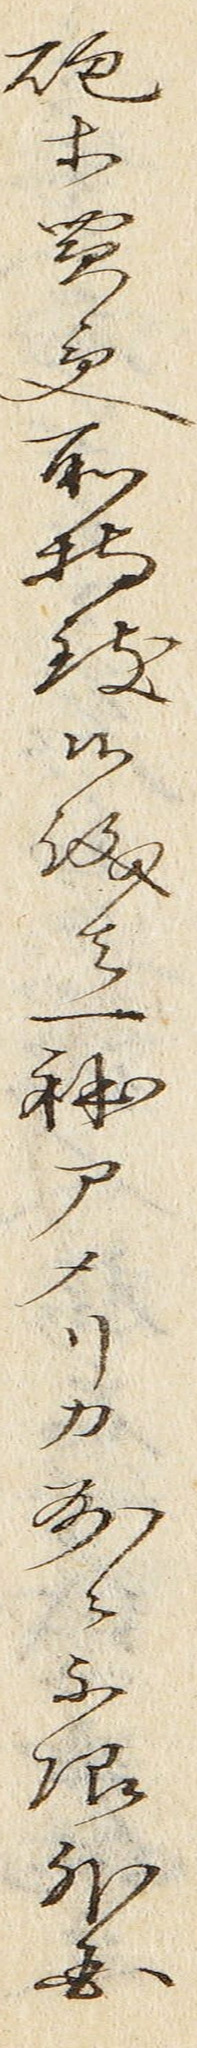砲等買受所持致候儀は一躰アメリカ州に不限外国
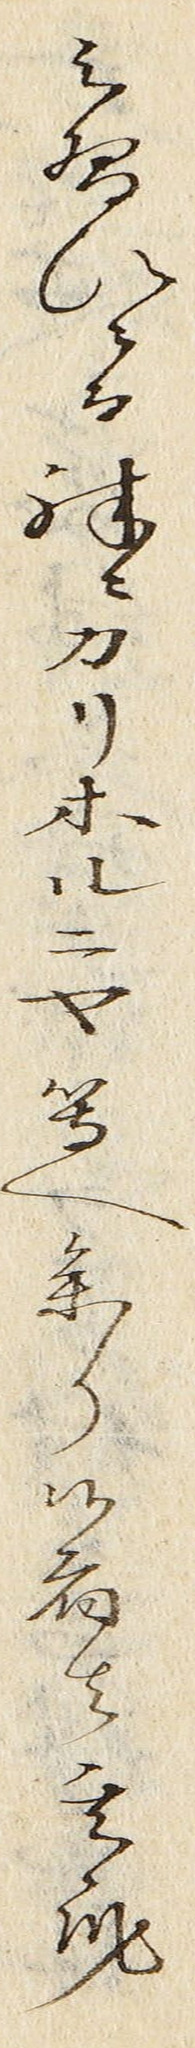之習ひに而殊にカリホルニヤ等へ参り候者は其身
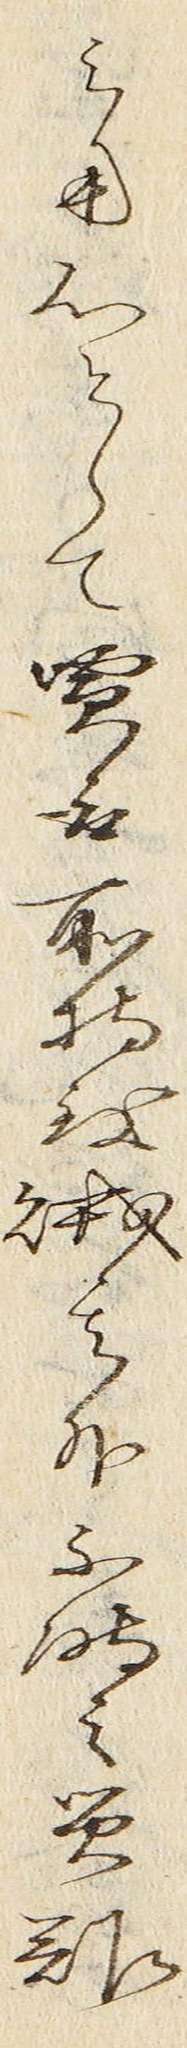之用心として買取所持致賊其外不時之災難
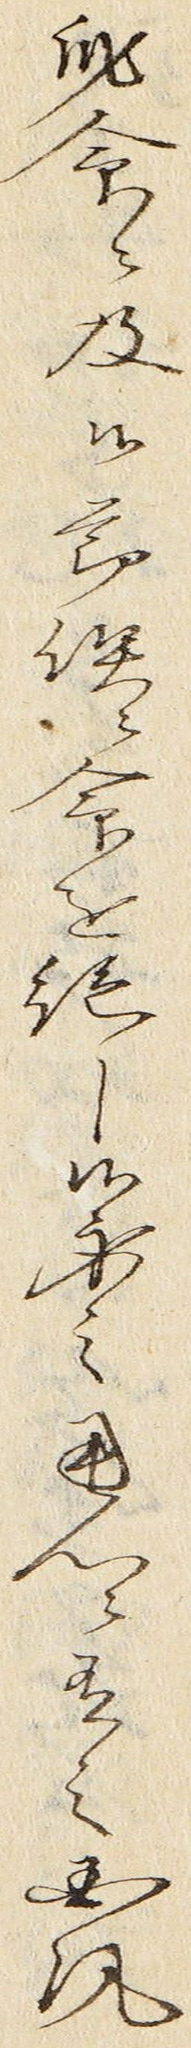身命に及候節俱に命を絶し候身之用心に有之国風
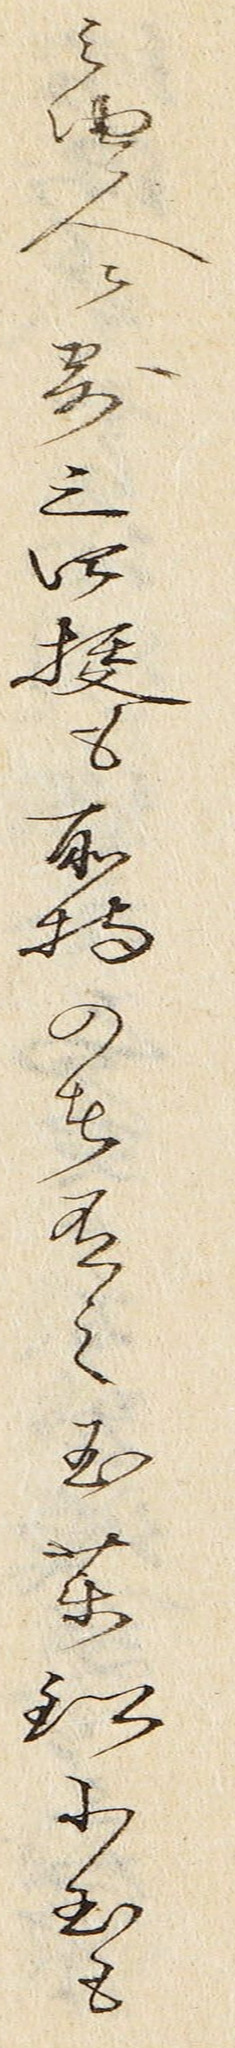之由人に寄三四張挺も所持の者有之玉薬鉛に玉も
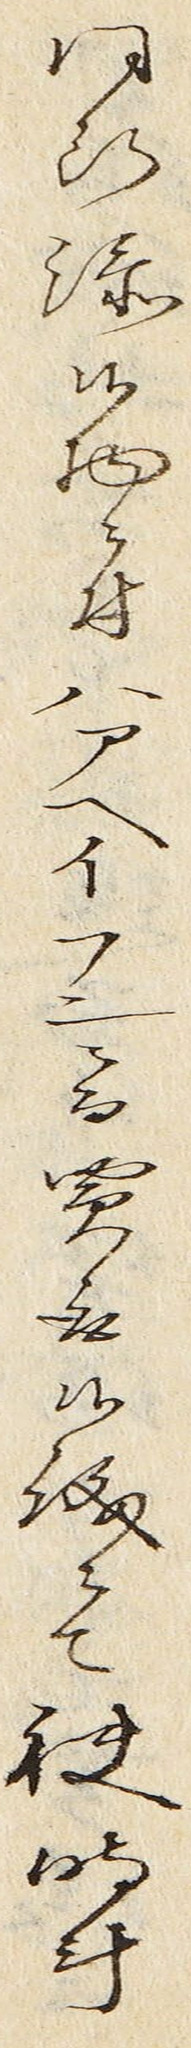同断添候物に付ハアへイフンに而買取候儀にて袂時計
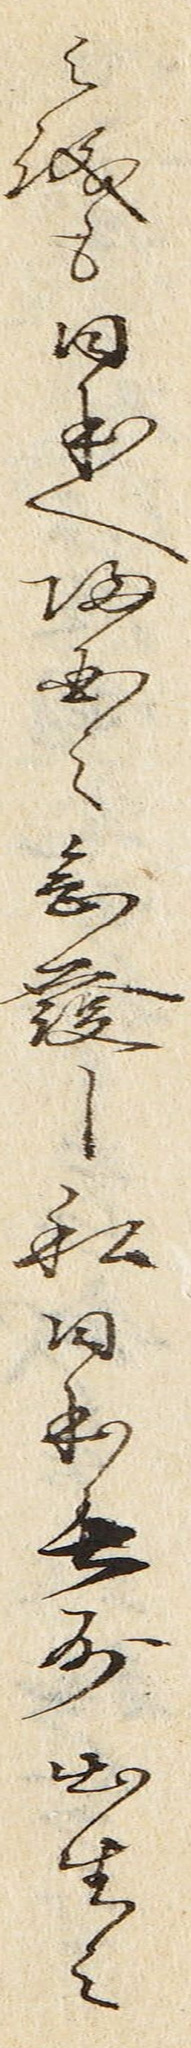之儀も日本へ帰国之念発し私日本土州出生之
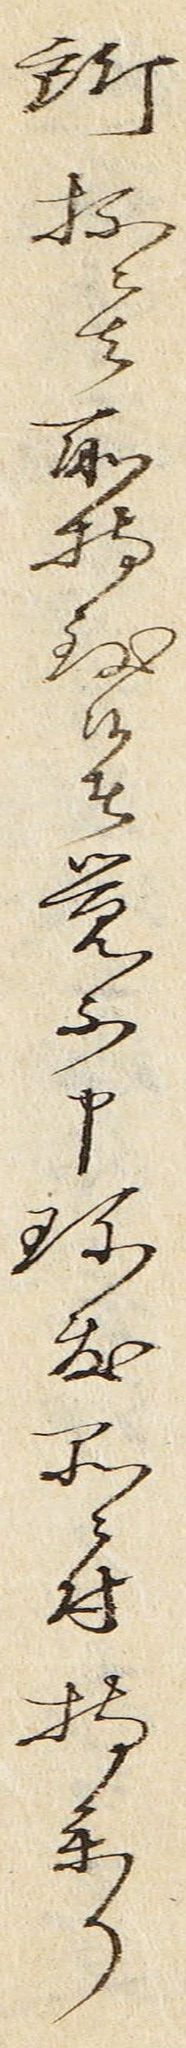所抔には所持致候は覚不申珍敷品に付持参り
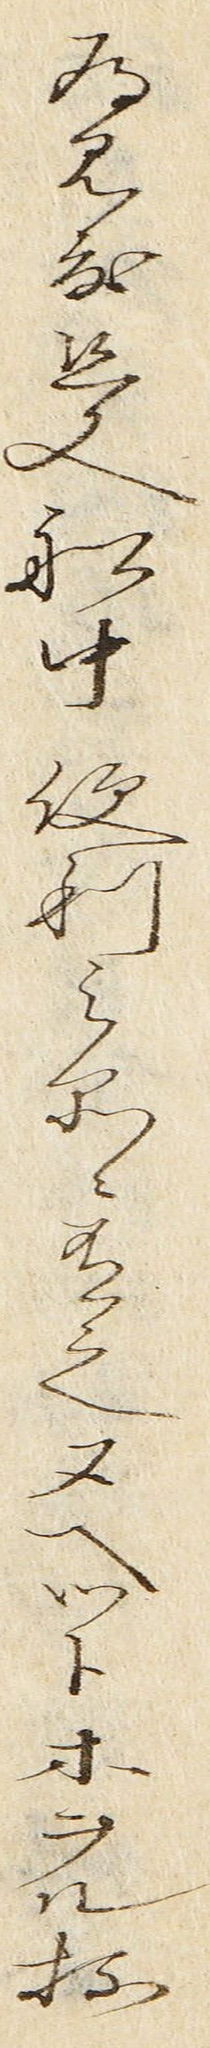為見度且又船中便利之品に有之ヌヘツトホヲル抔
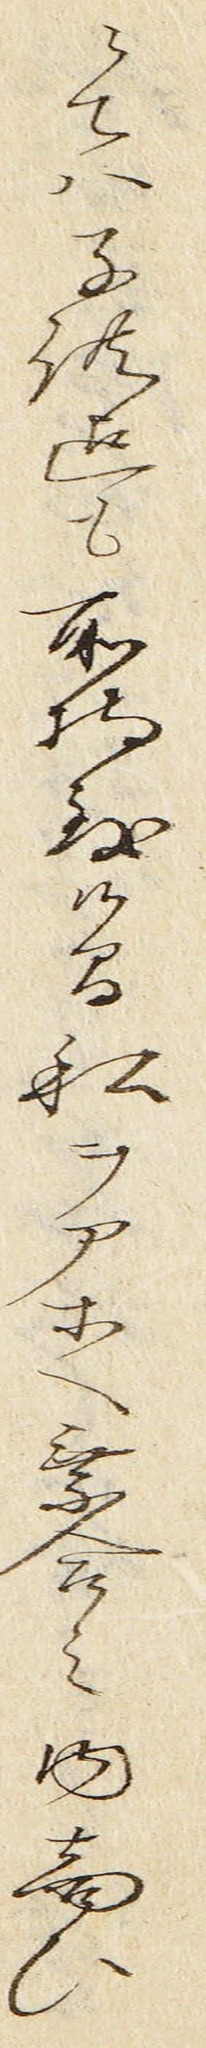にては子供迄も所持致候間私ヲアホへ乗合之内商ひ
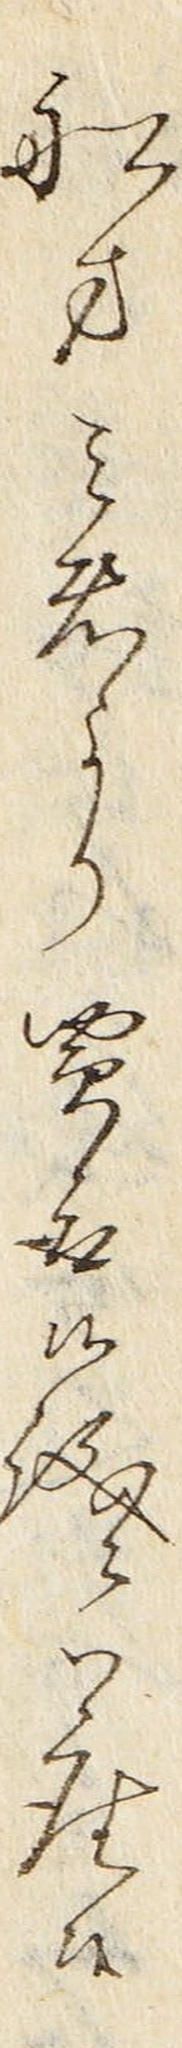船方之者より買取候儀に御座候
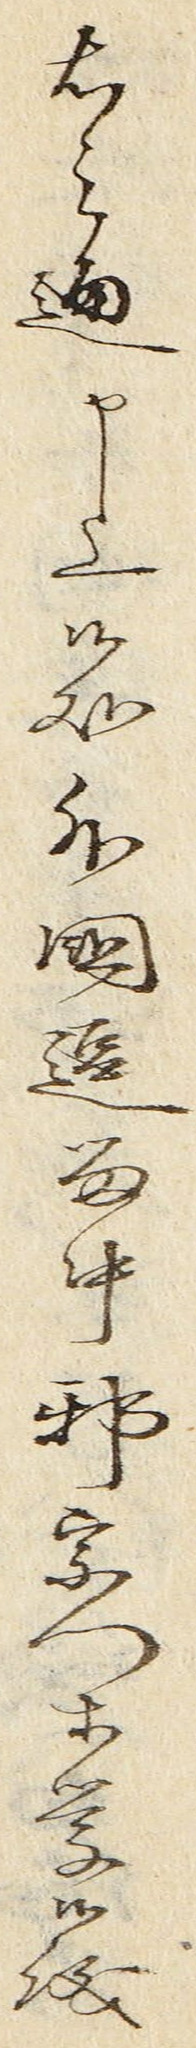右之通申上候処外国逗留中邪宗門等学候儀
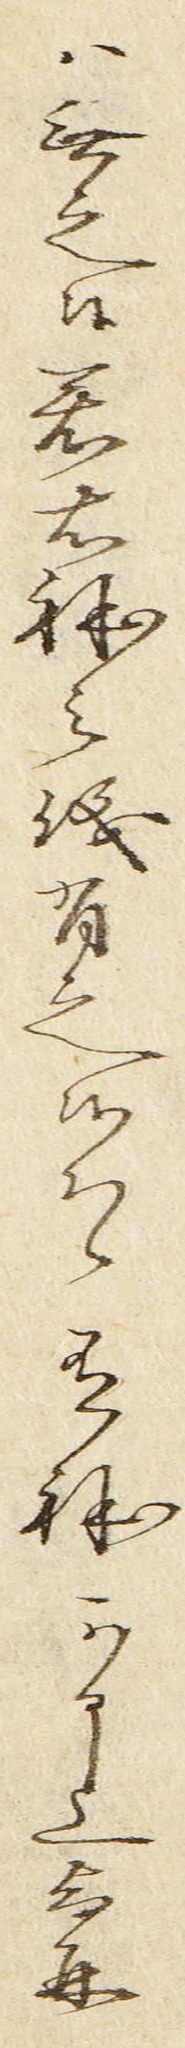は無之候若右躰之儀有之候はゝ有躰可申上旨再

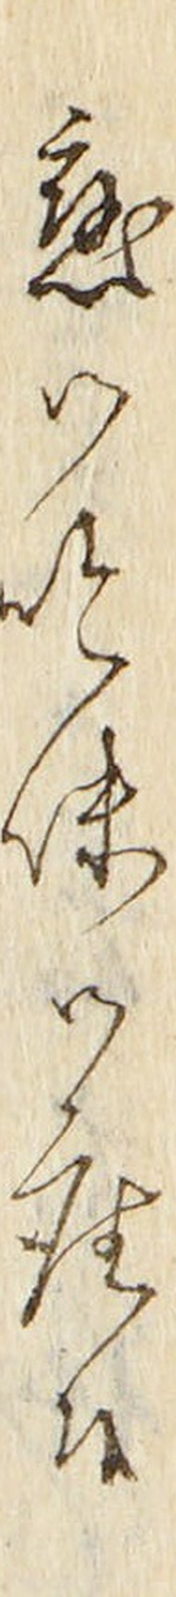応御吟味御座候
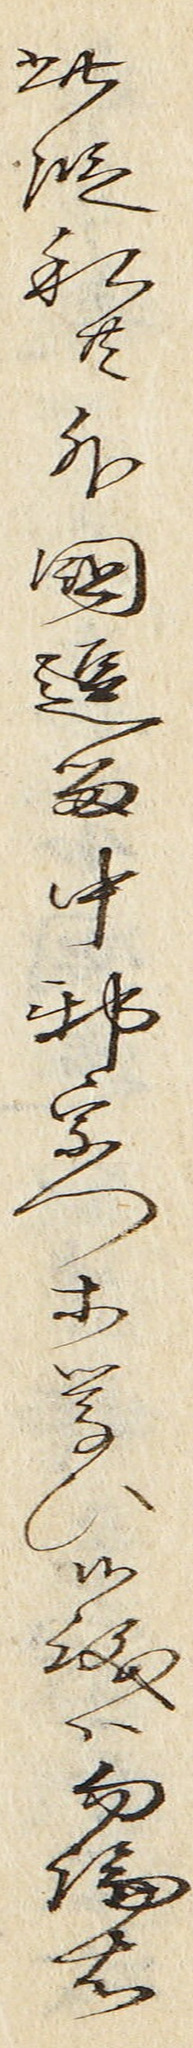此段私共外国逗留中邪宗門等学ひ候儀は勿論右
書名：土佐中浜万次郎漂流記
